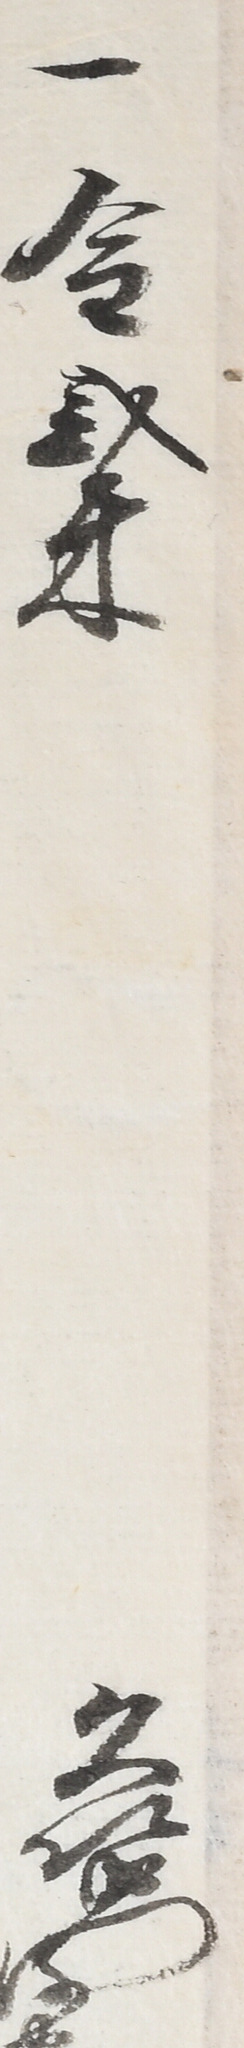一金弐朱定右衛門
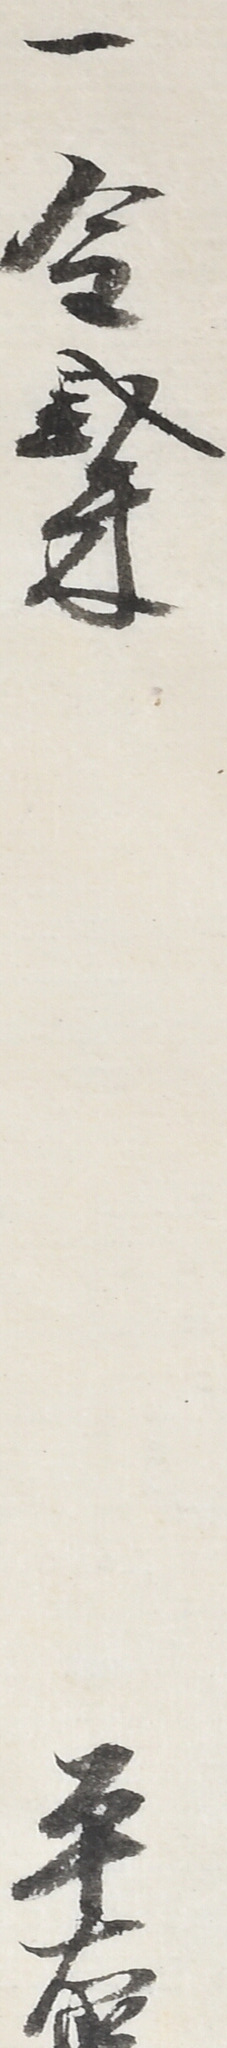一金弐朱平右衛門
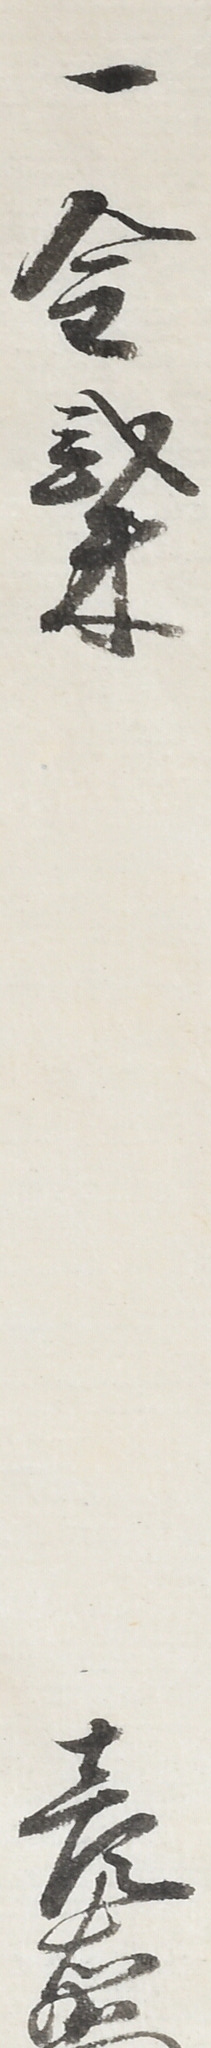一金弐朱彦右衛門
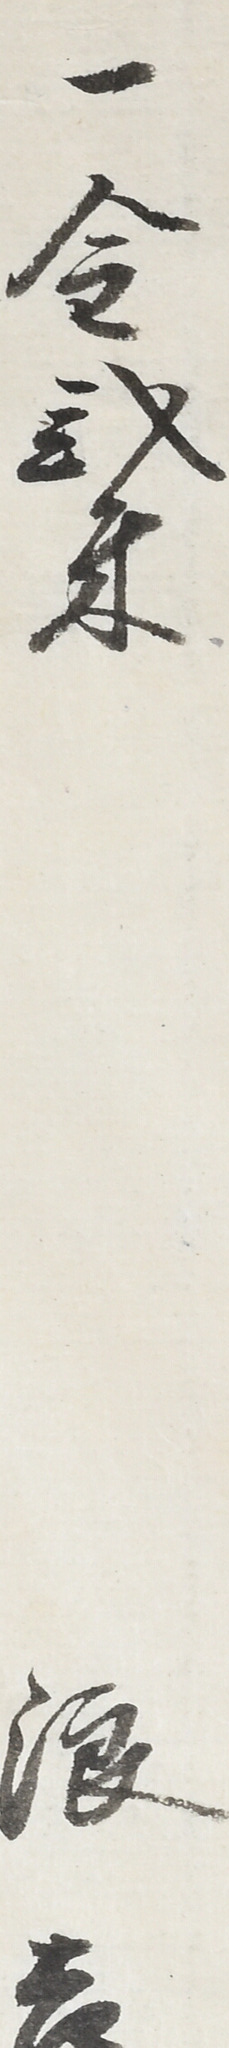一金弐朱浪吉
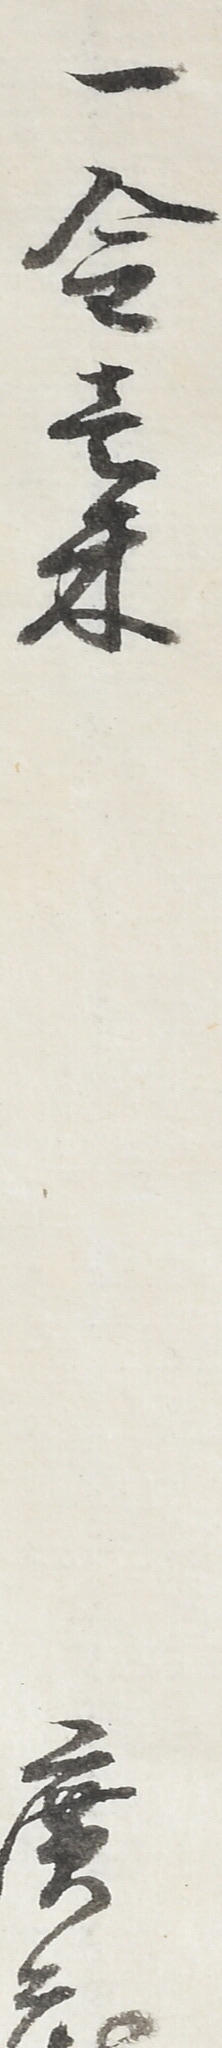一金弐朱浪吉

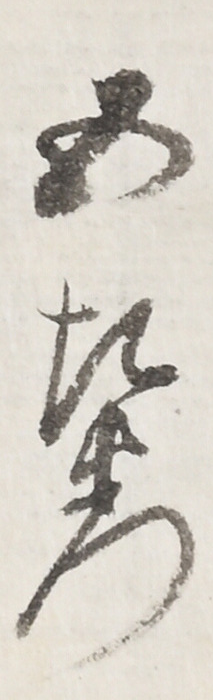治左衛門
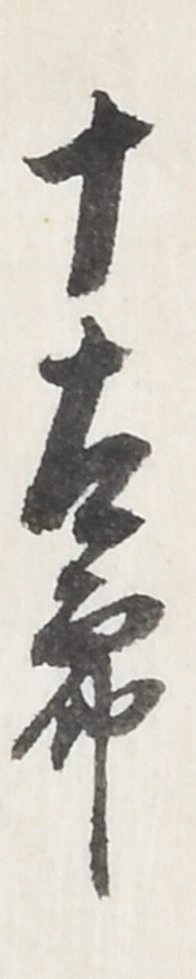十太郎
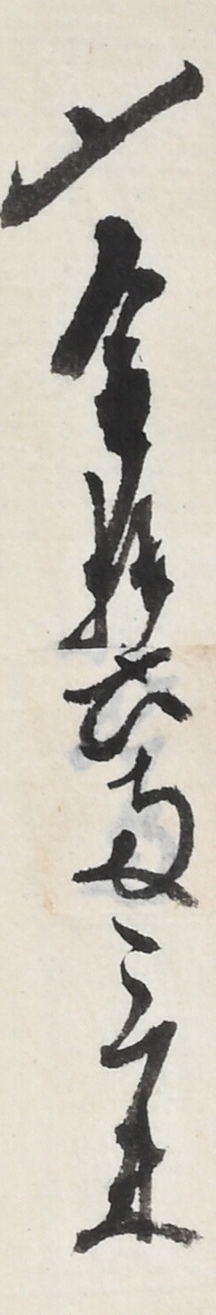〆金拾六両三朱

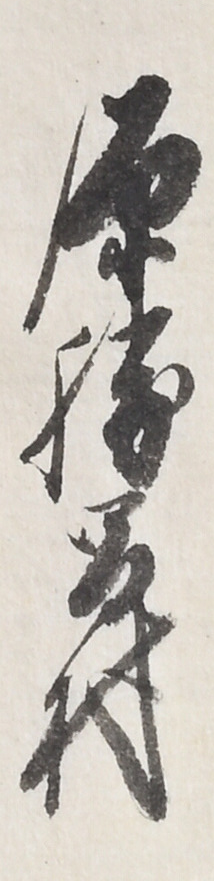原勝間村
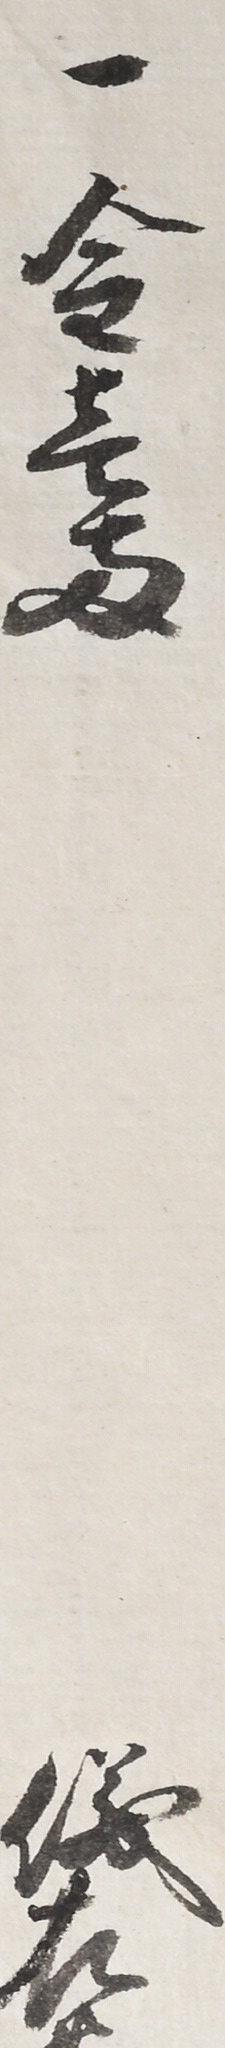一金壱両蔦右衛門
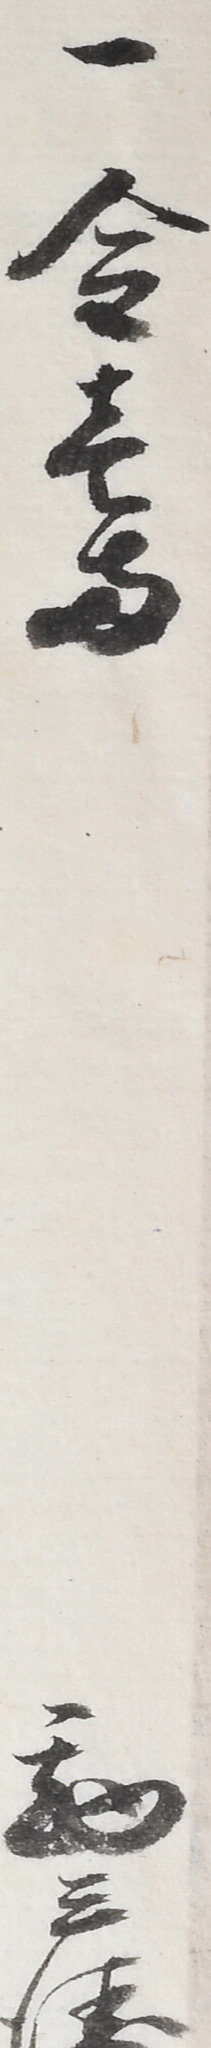一金壱両勘兵衛
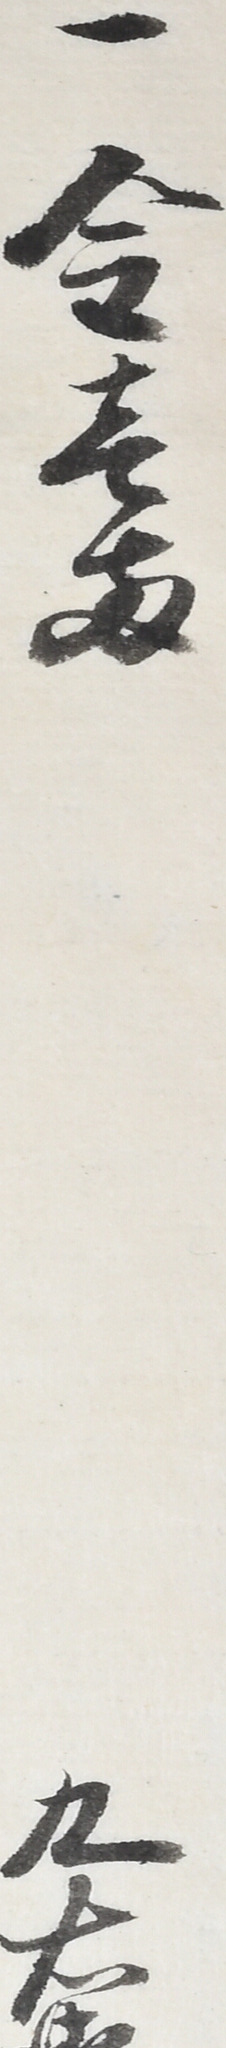一金壱両九右衛門
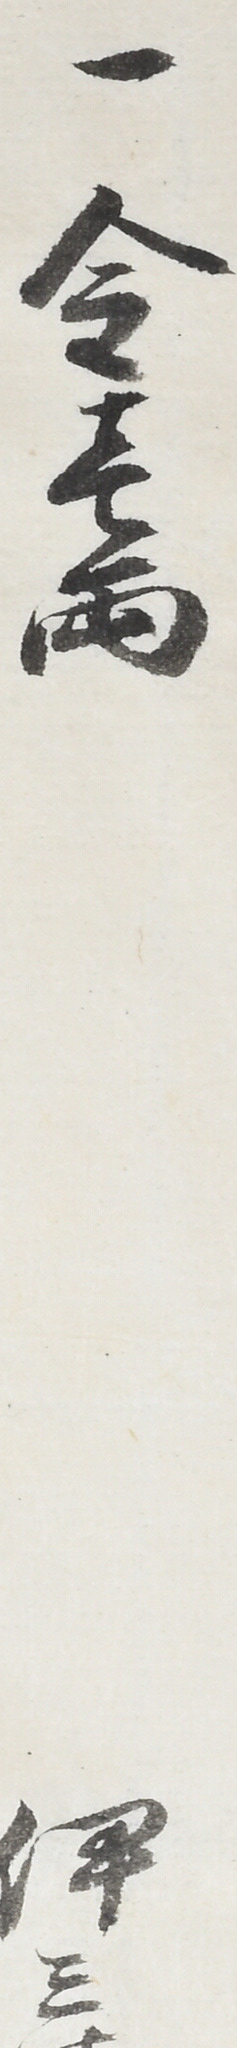一金壱両伊兵衛

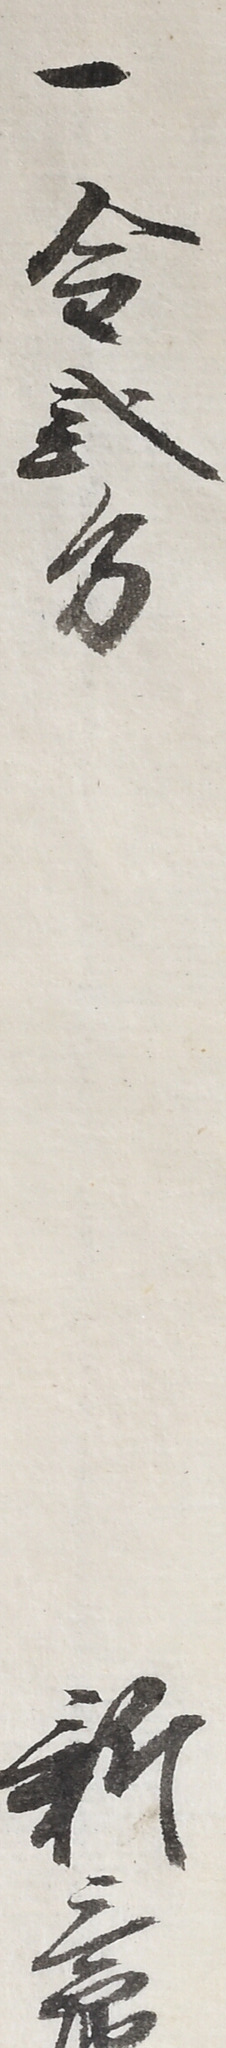一金弐分新三郎
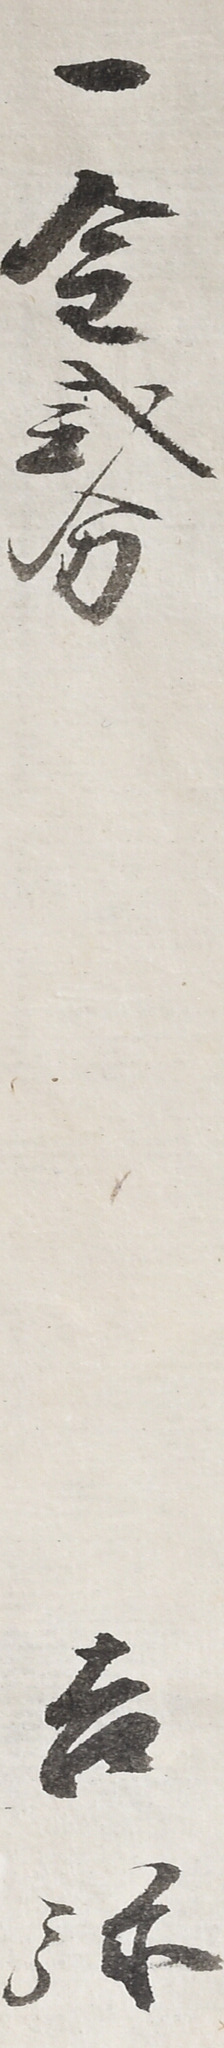一金弐分吉弥
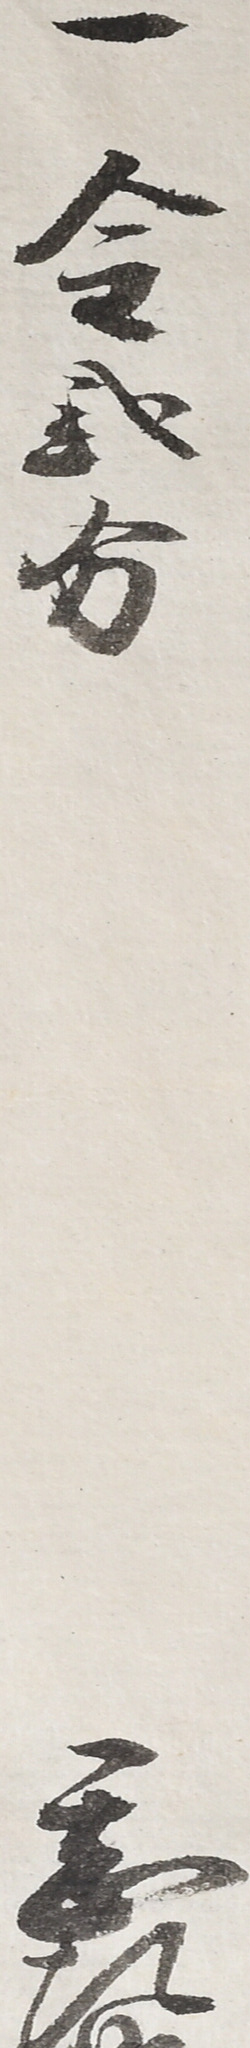一金弐分吉弥
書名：御拝地百五拾年御祝儀献上御目録名前
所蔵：伊那市立高遠町図書館・合同会社AMANE
